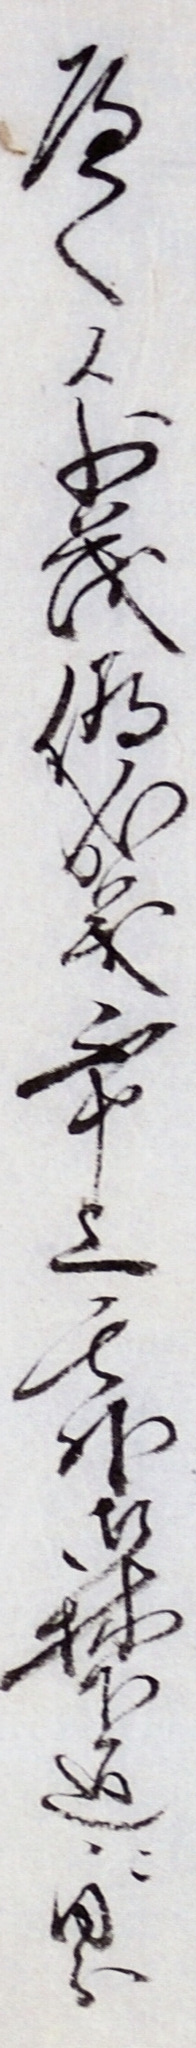へく候少も偽成義不申上其外御林下通ニ自分
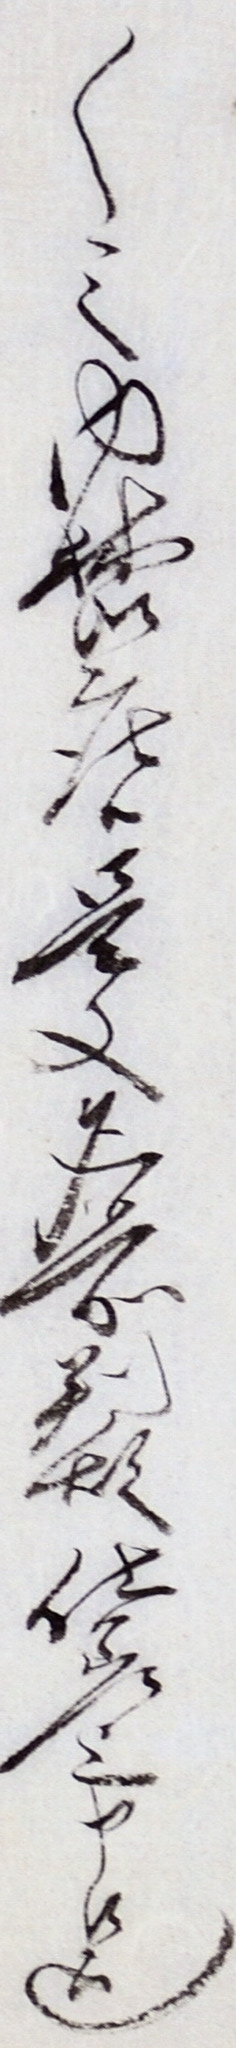〳〵之内林御座候是又名前判形仕差上申候通
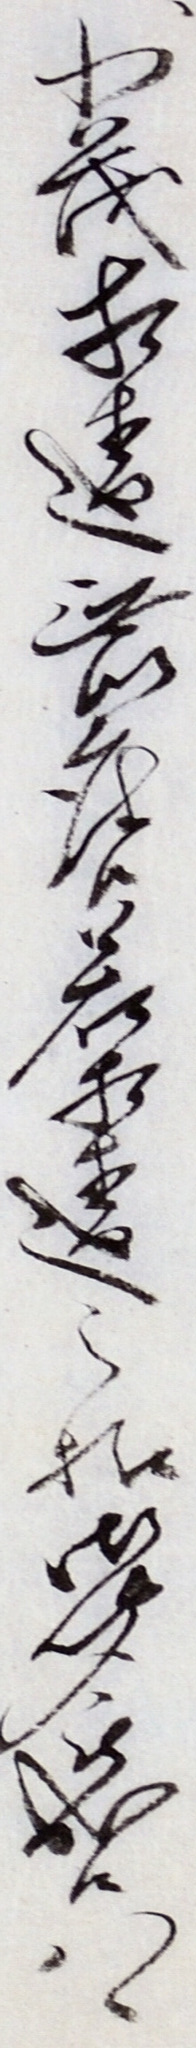少も相違無御座候若相違之様御聞被成候ハヽ
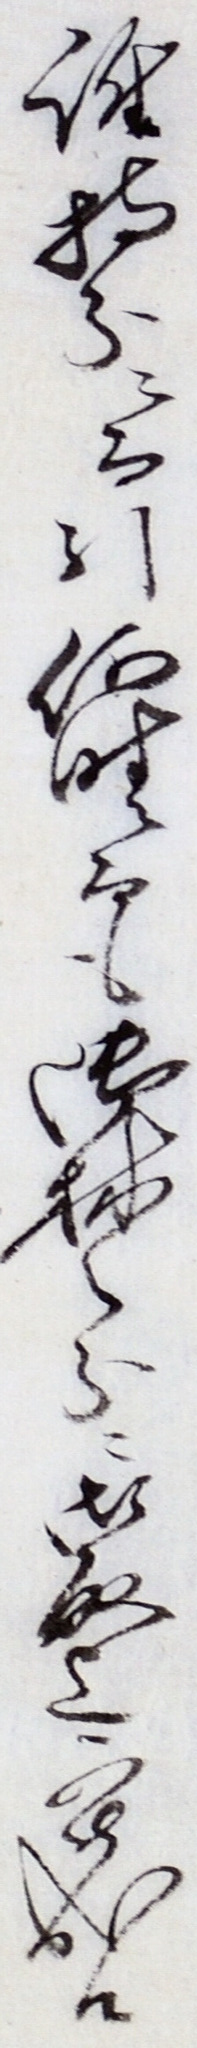誰持分ニ而引何時ニ而も御林之分ニ御取上可被成候
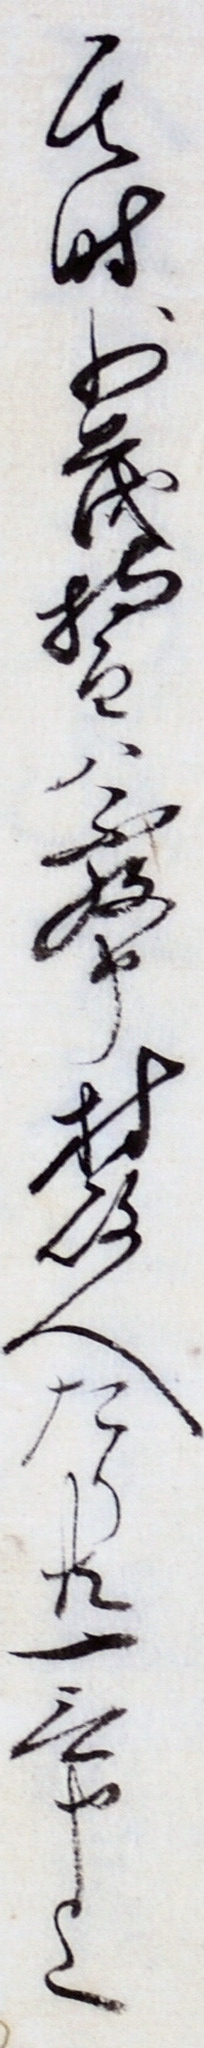其時少も持主ハ不及申村役人たり共一言申上
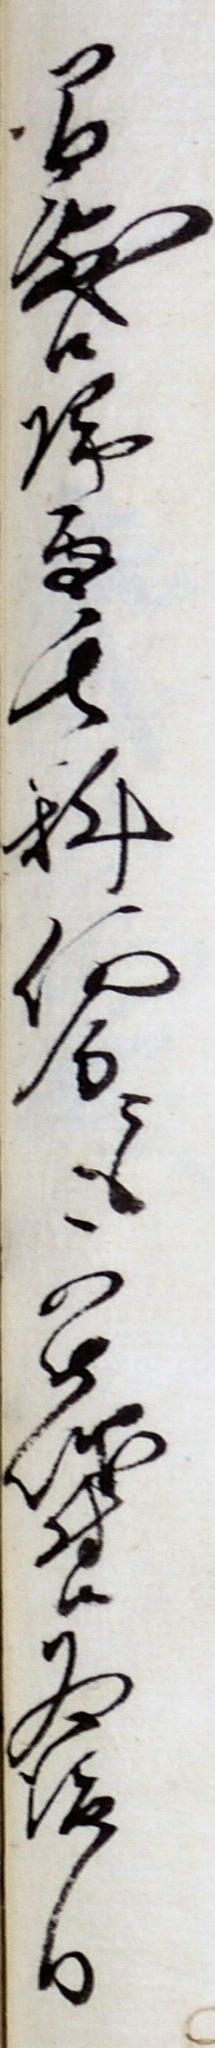間敷候帰而其科何分ニも可被仰付候為後日
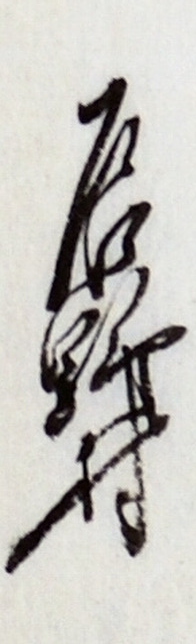辰野村
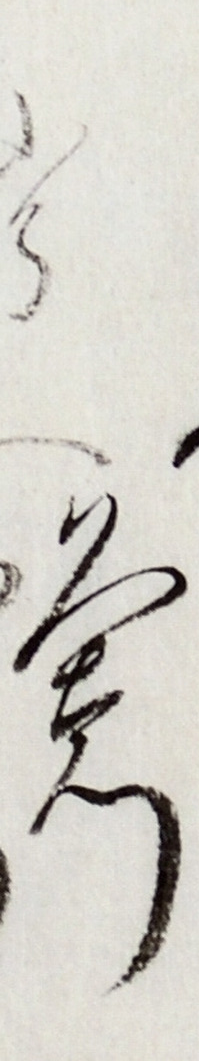甚右衛門
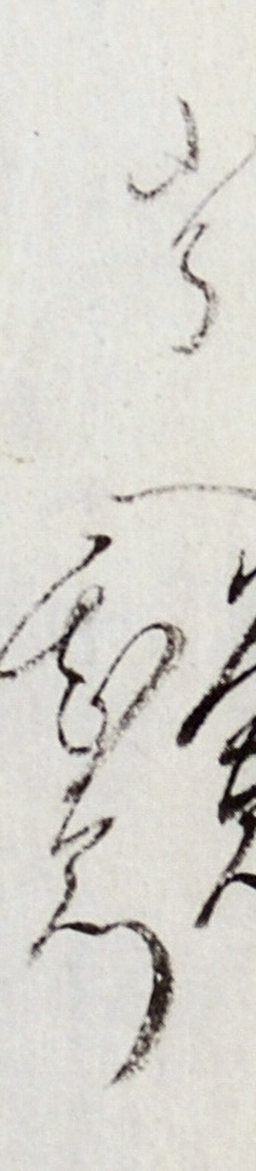甚右衛門
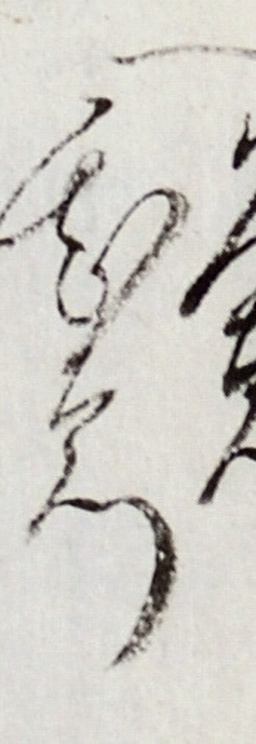甚右衛門
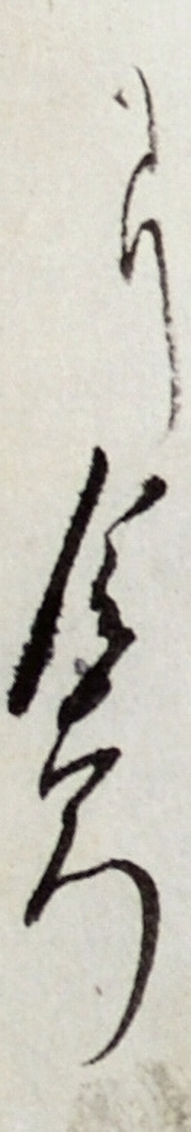甚右衛門

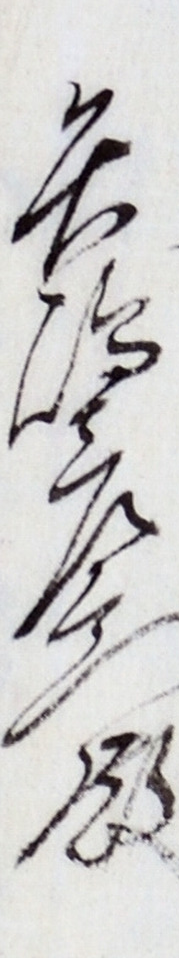矢嶋彦右衛門殿
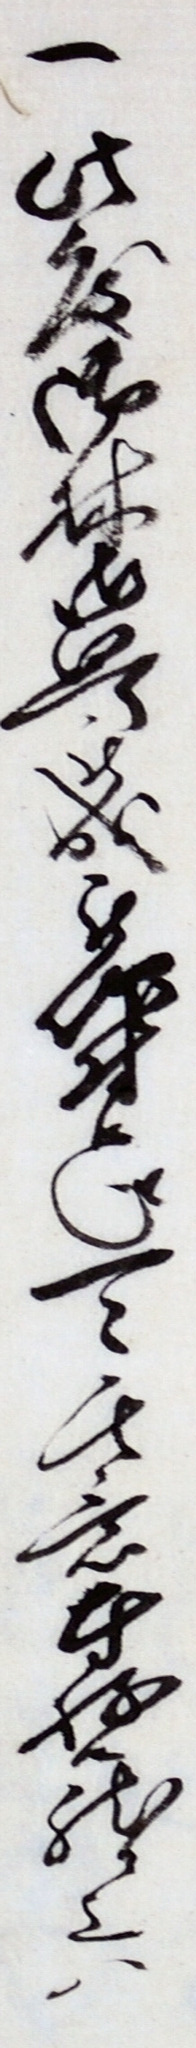一此度御林御廻り被成被仰付候趣一々其意奉存候然ル上ハ
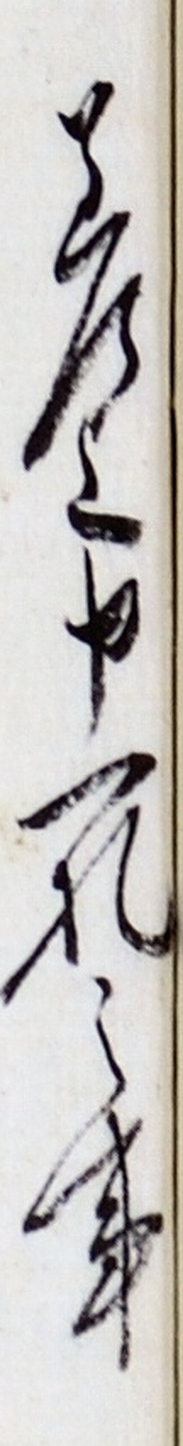差上申一札之事
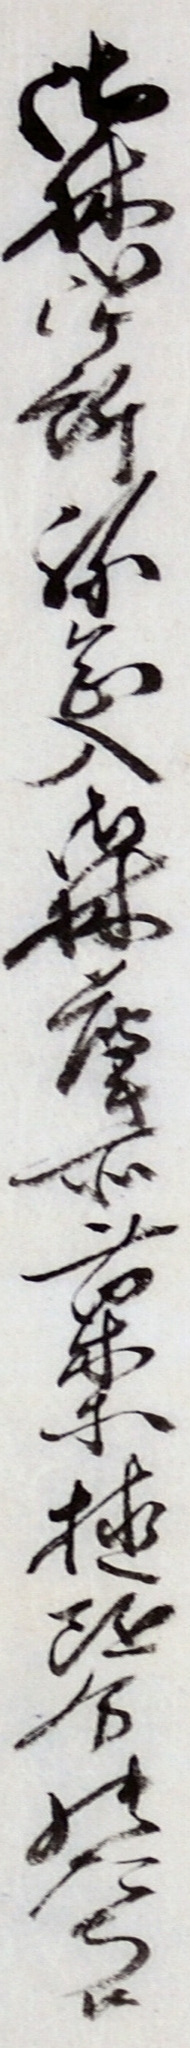御林弐ケ所弥念入御林薄キ所苗木等植随分能たち候
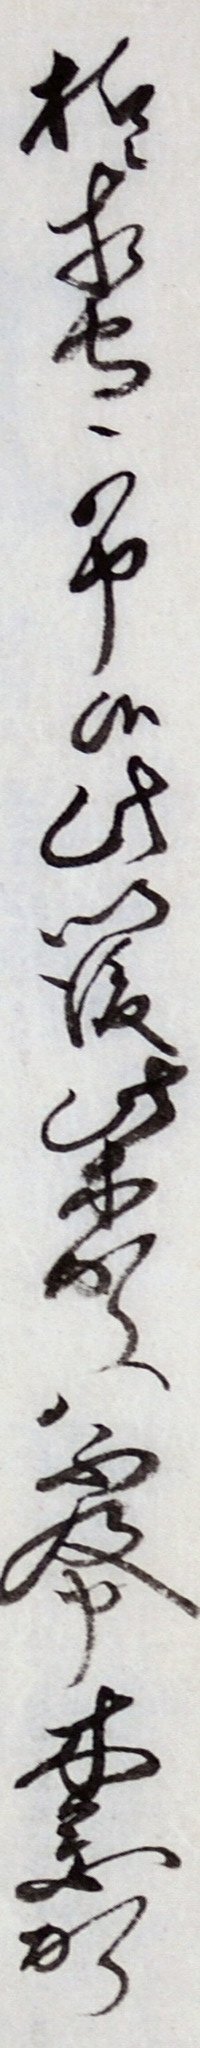様ニ相守可申候此以後柴かりハ不及申木葉かり
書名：御林御竹藪証文控
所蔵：伊那市立高遠町図書館・合同会社AMANE
